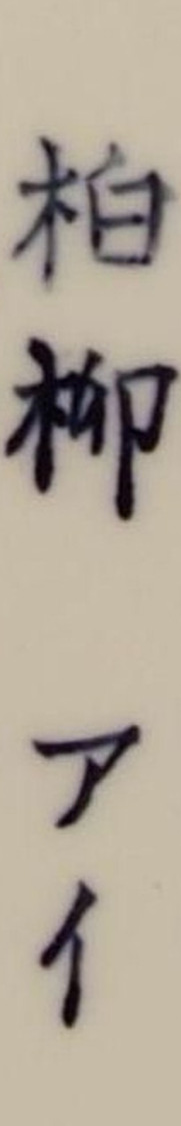柏柳アイ
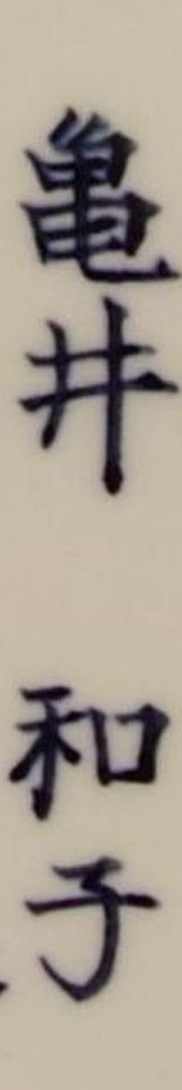亀井和子
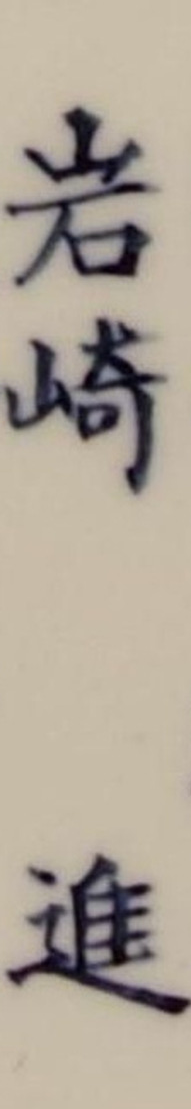岩崎進
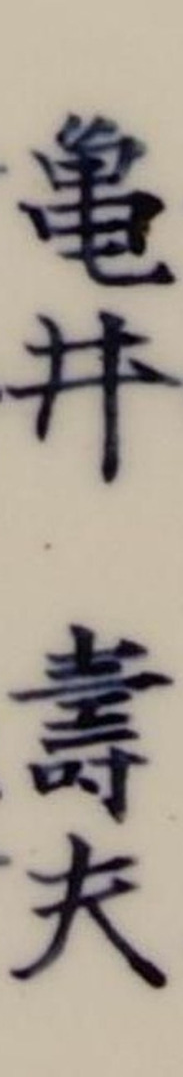亀井壽夫
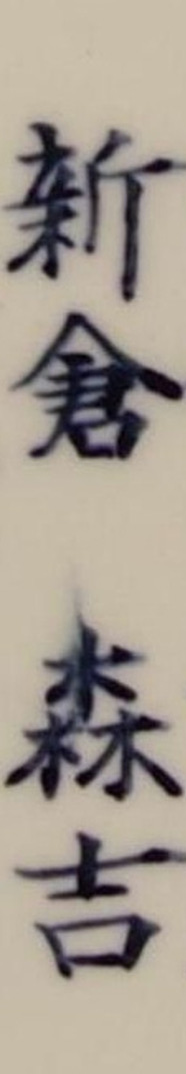新倉森吉
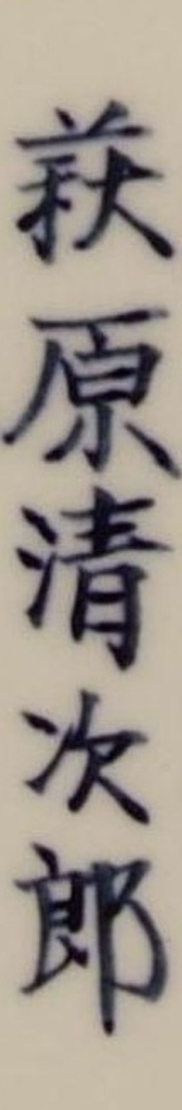萩原清次郎
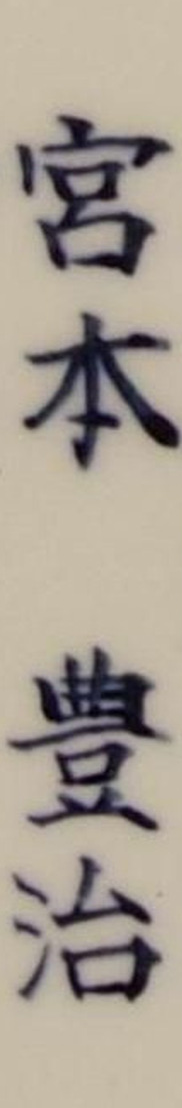宮本豊治
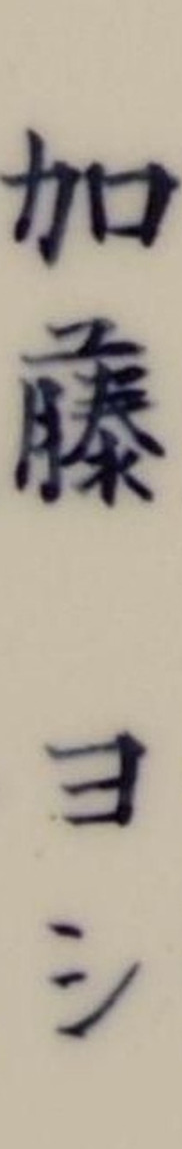加藤ヨシ
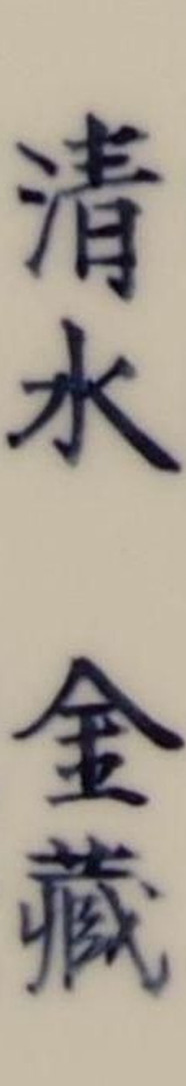清水金蔵
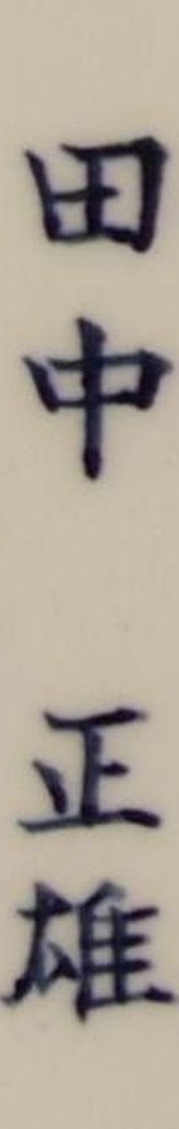田中正雄
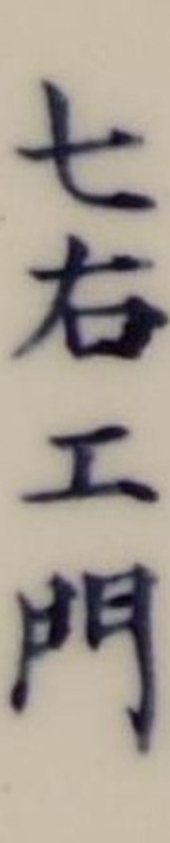七右エ門
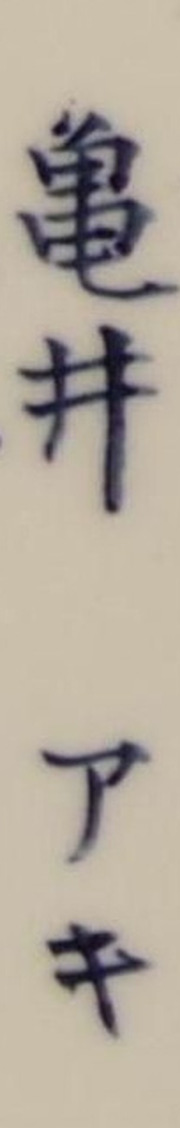亀井アキ
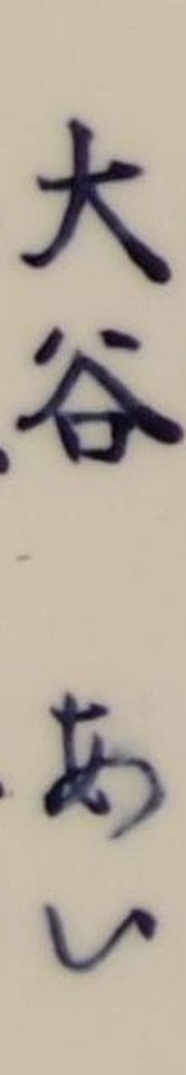大谷あい
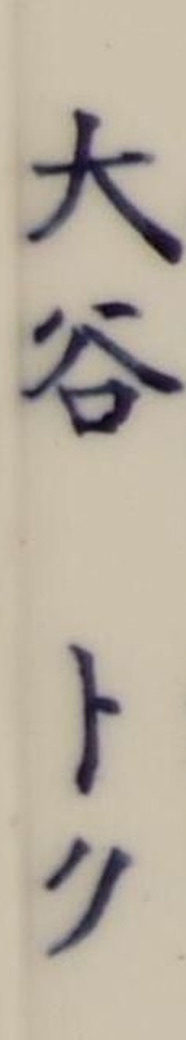大谷トク

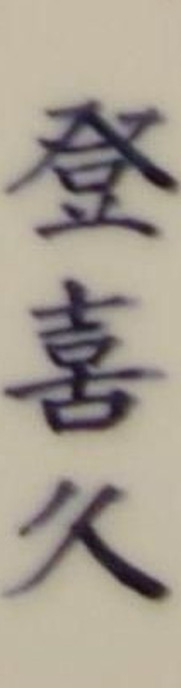登喜久
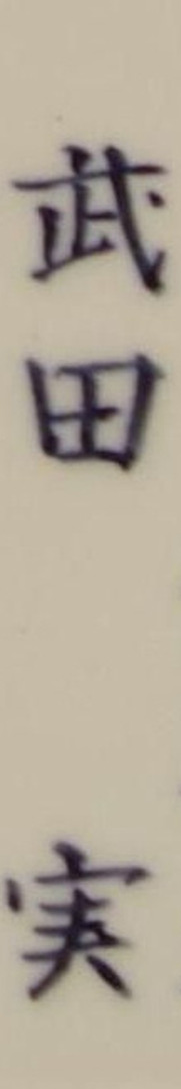武田実
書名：M~S
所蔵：高野山金剛峯寺
